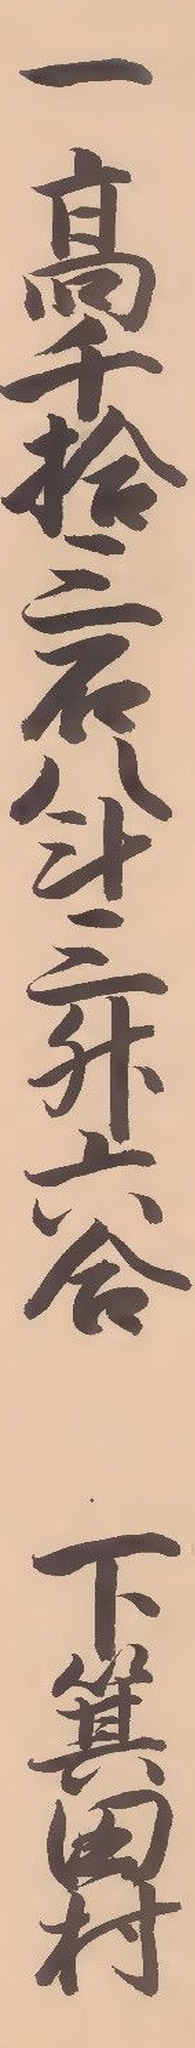一高千拾三石八斗三升六合下箕田村
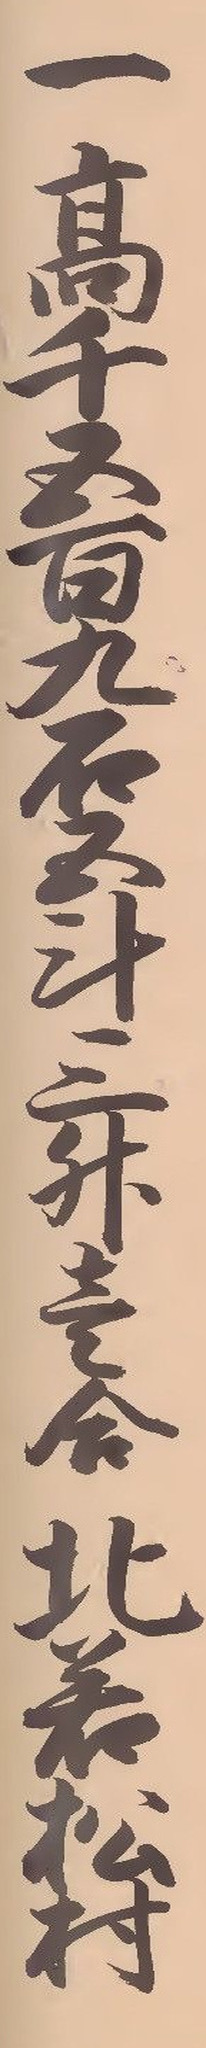一高千五百九石五斗三升壱合北若松村
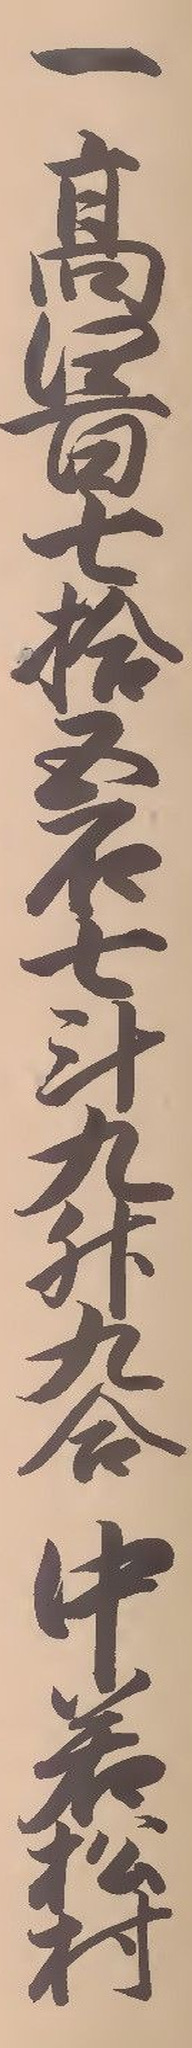一高四百七拾五石七斗九升九合中若松村
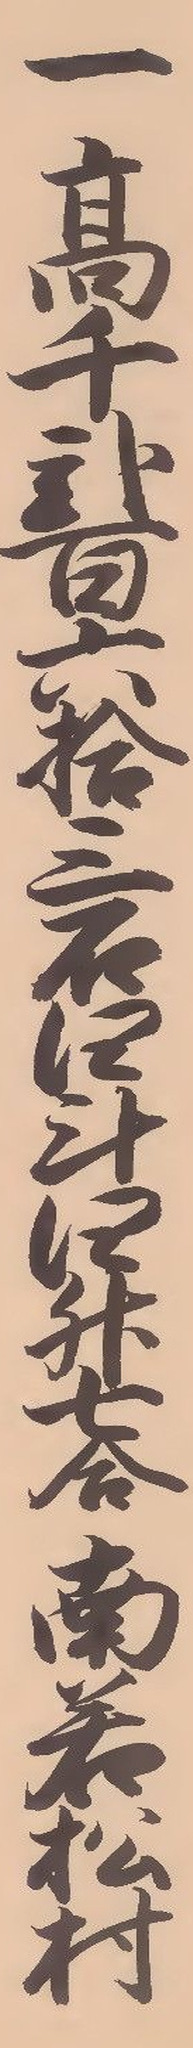一高千弐百六拾三石四斗四升七合南若松村
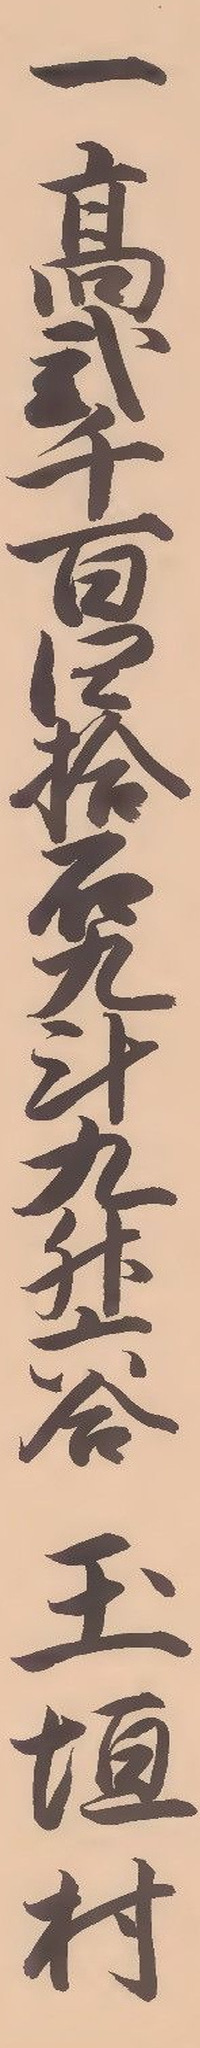一高弐千百四拾石九斗九升六合玉垣村
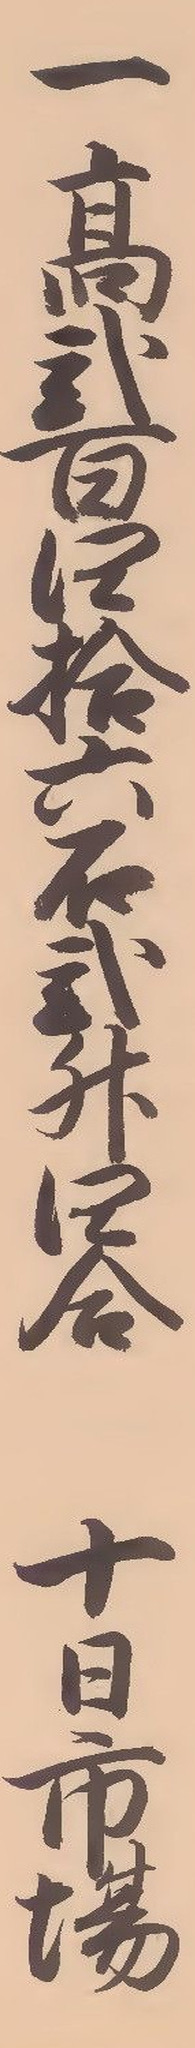一高弐百四拾六石弐升四合十日市場

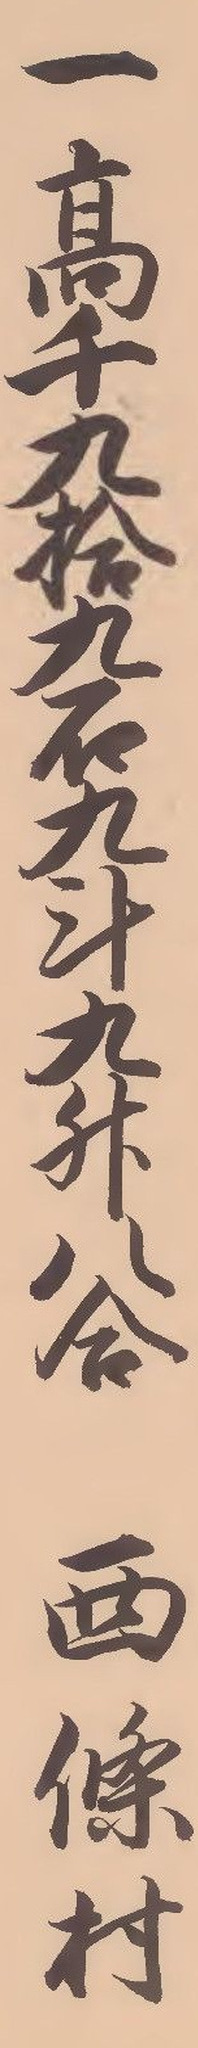一高千九拾九石九斗九升八合西条村
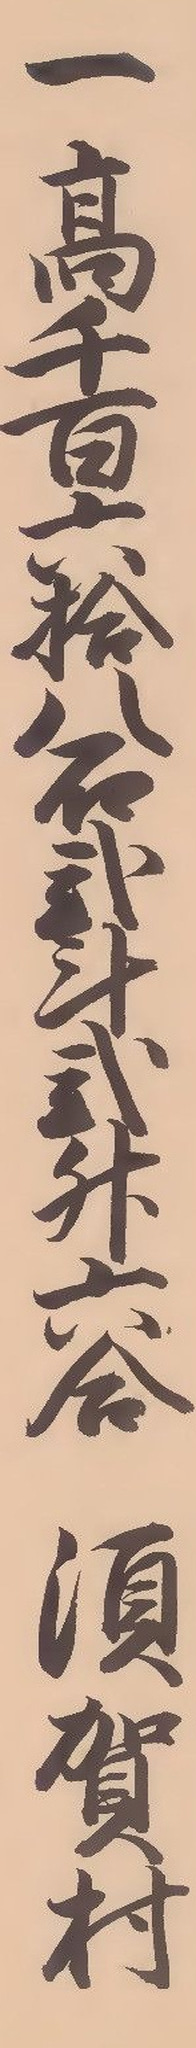一高千百六拾八石弐斗弐升六合須賀村
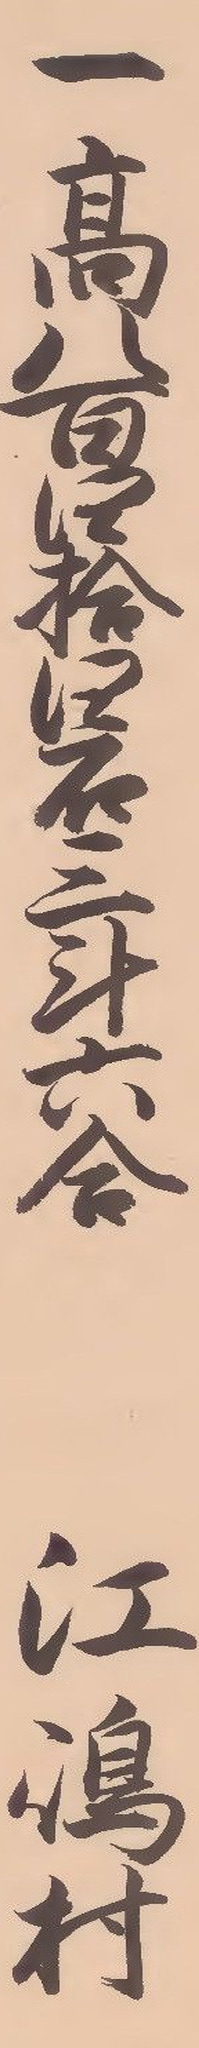一高八百四拾四石三斗六合江嶋村
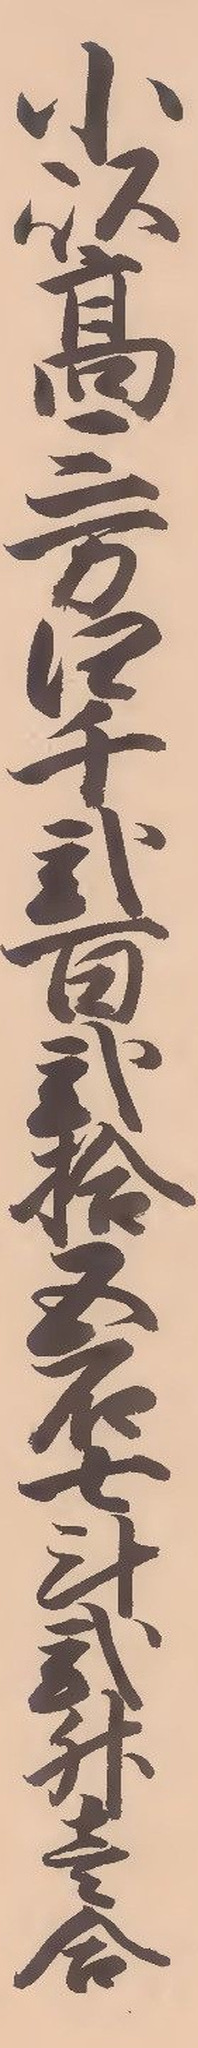小以高三万四千弐百弐拾五石七斗弐升壱合

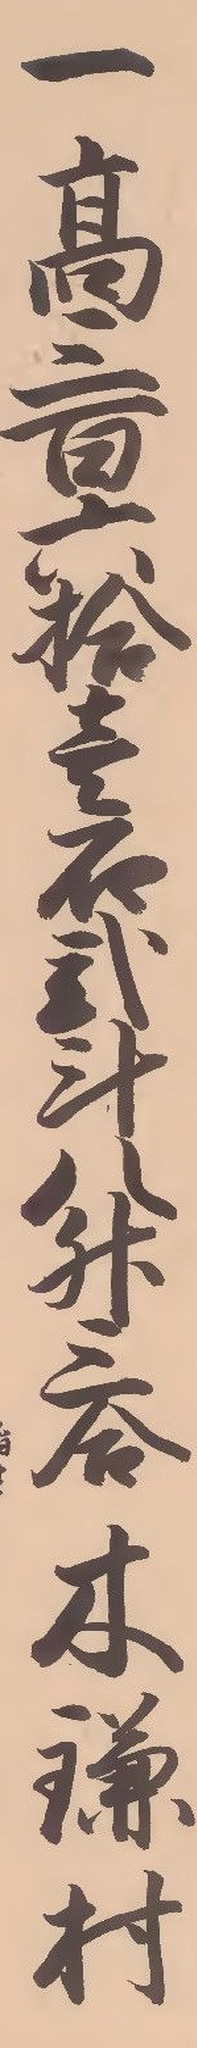一高三百六拾壱石弐斗八升三合木鎌村
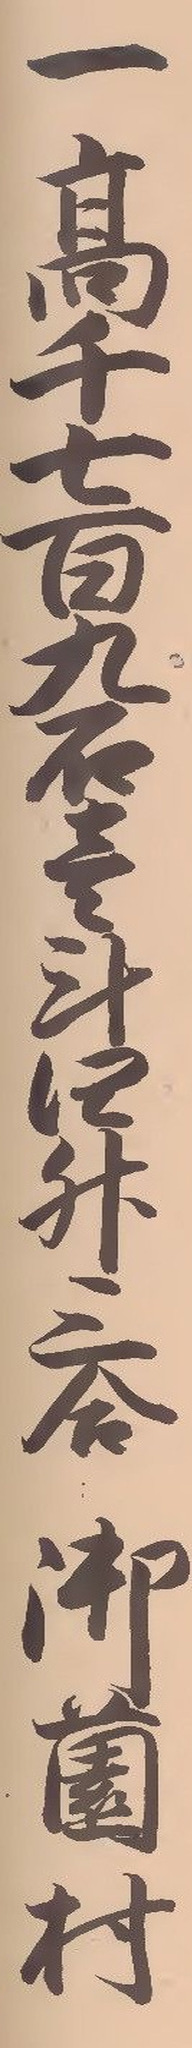一高千七百九石壱斗四升三合御薗村
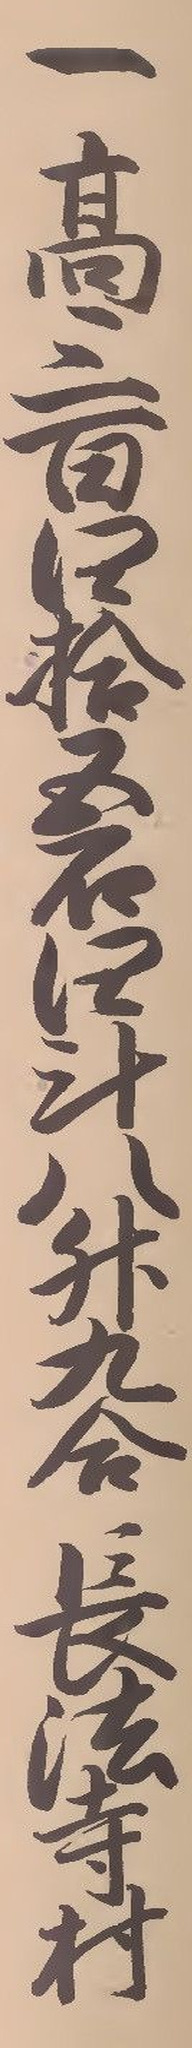一高三百四拾五石四斗八升九合長法寺村
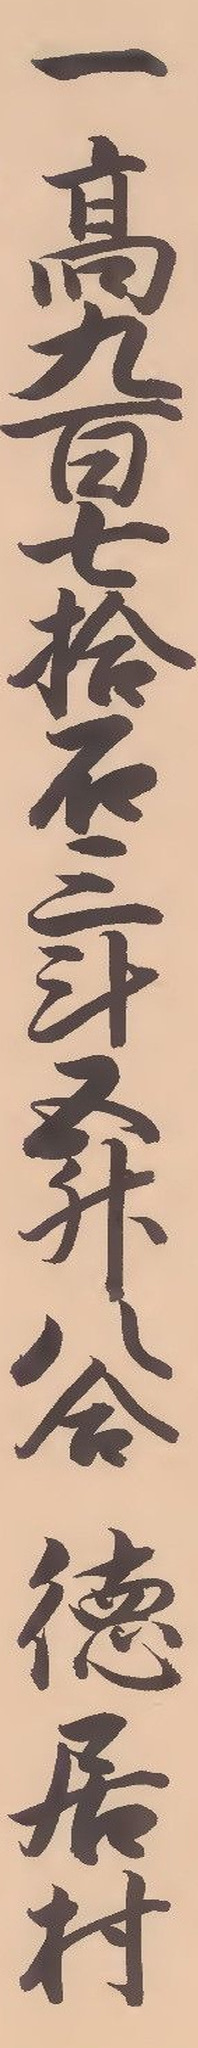一高九百七拾石三斗五升八合徳居村
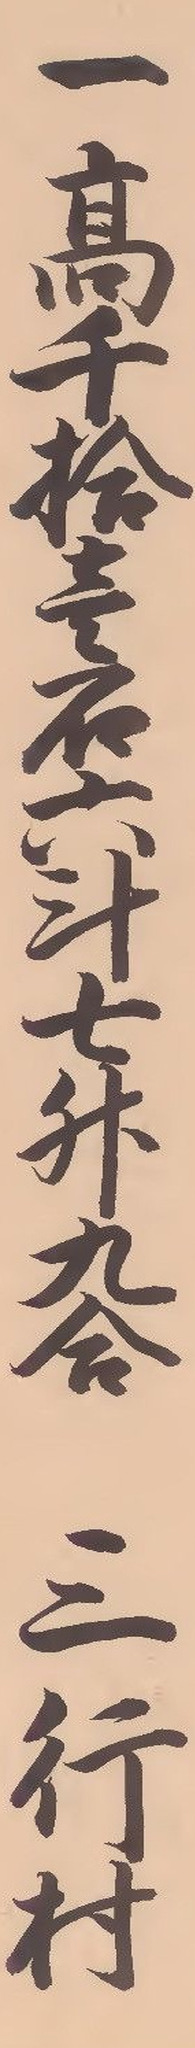一高千拾壱石六斗七升九合三行村

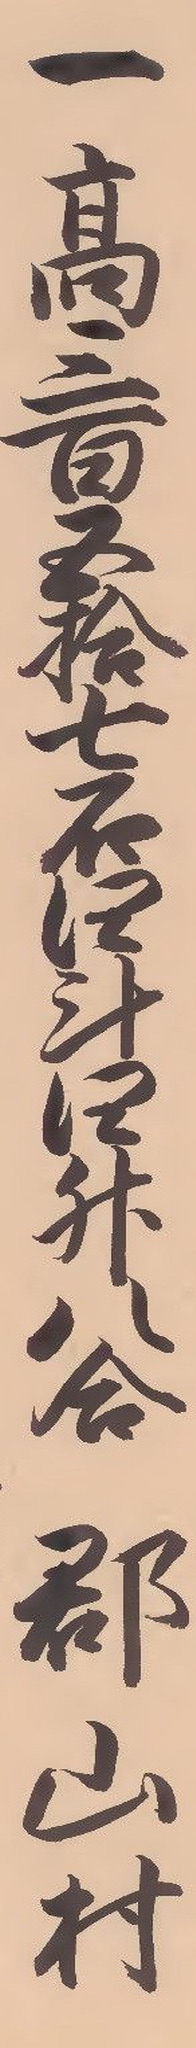一高三百五拾七石四斗四升八合郡山村
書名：伊勢国郷帳
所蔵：国立公文書館 National Archives of Japan
